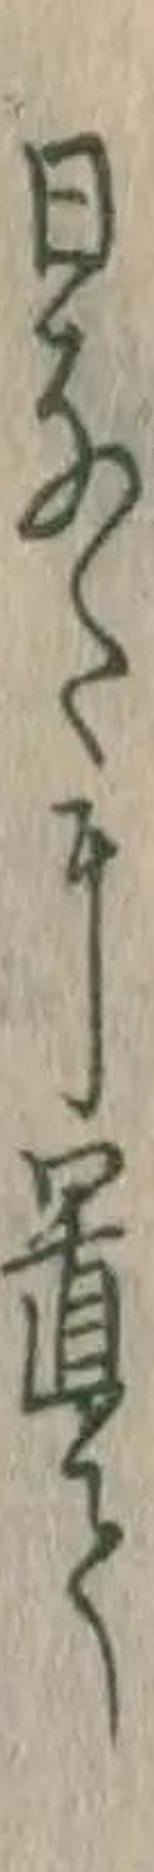日なたに置て
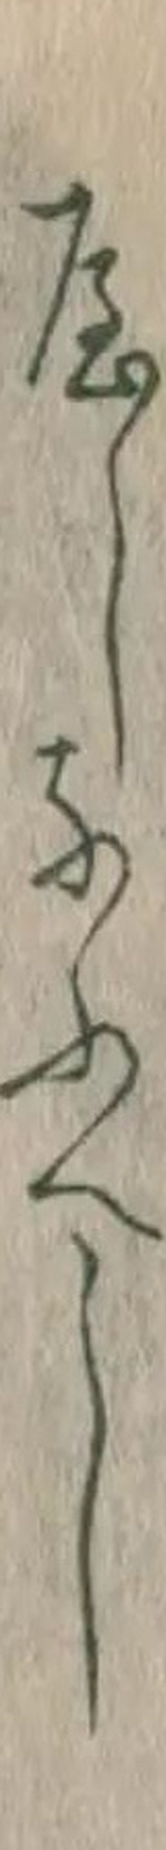やしなふへし
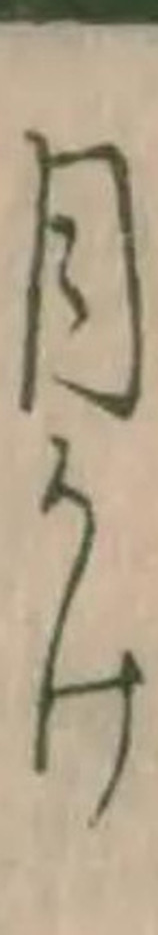月かけ
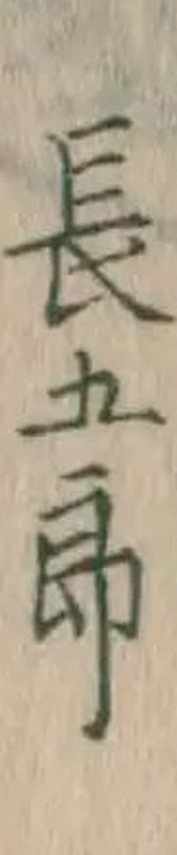長五郎
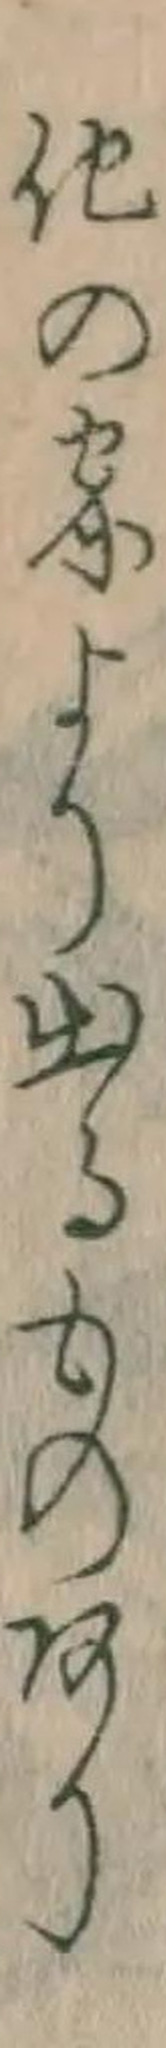他の家より出るものありし
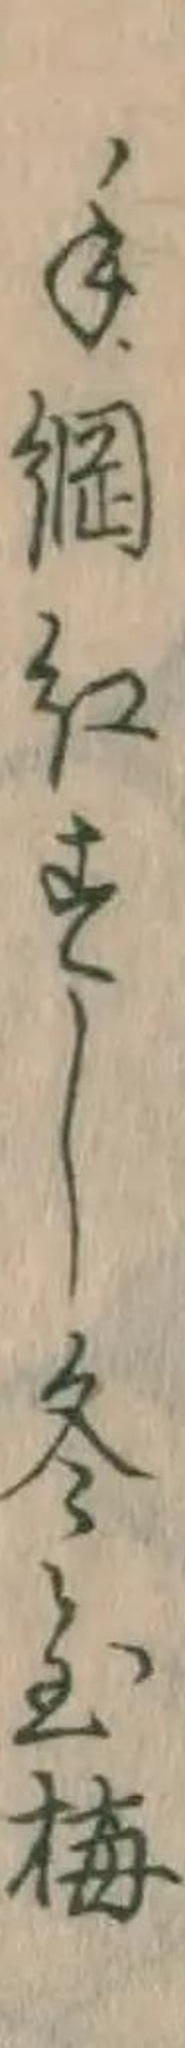手綱紅すし冬玉梅
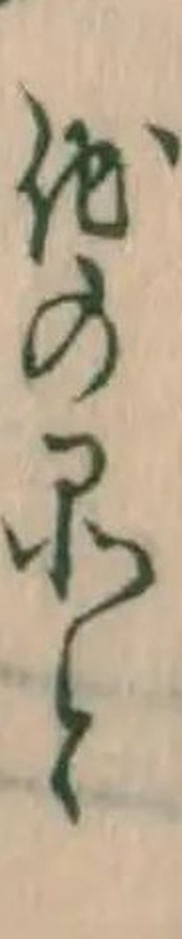他の品と
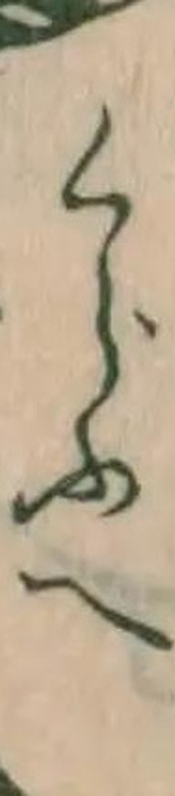くらふへ
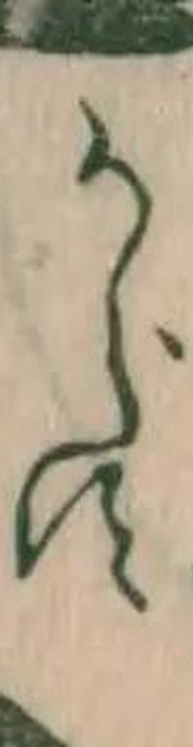からす
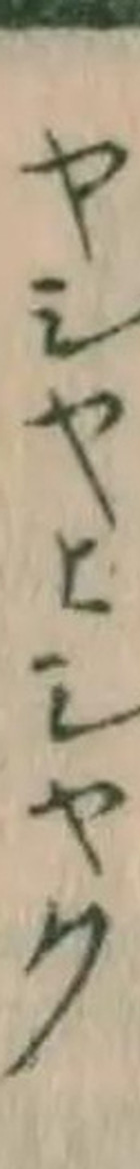ヤシヤヒシヤク
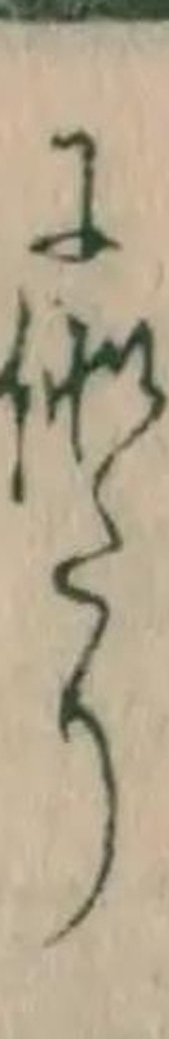に似たり
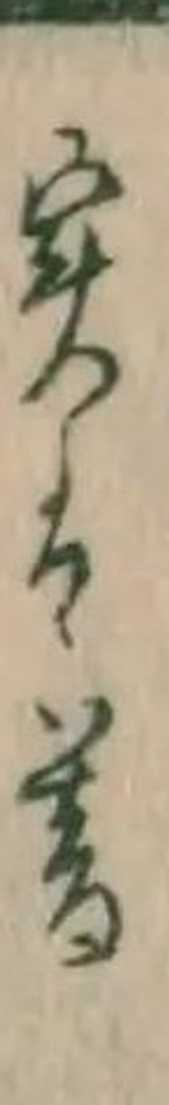実は美
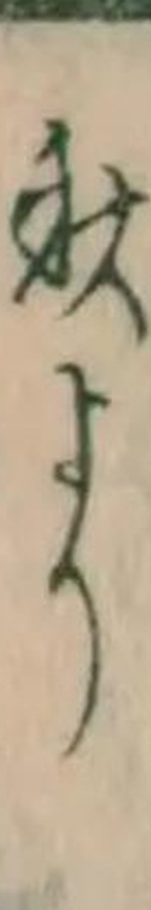秋より
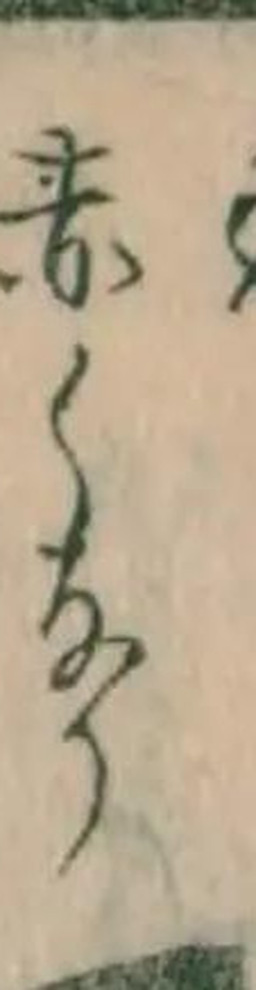赤くなり
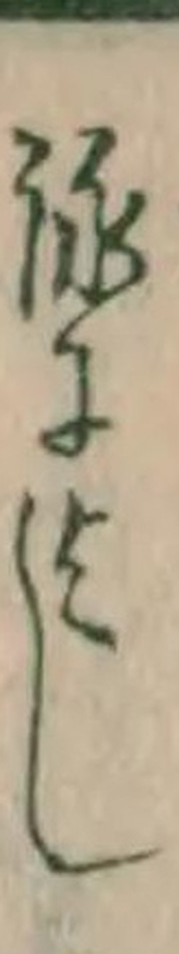詠によし
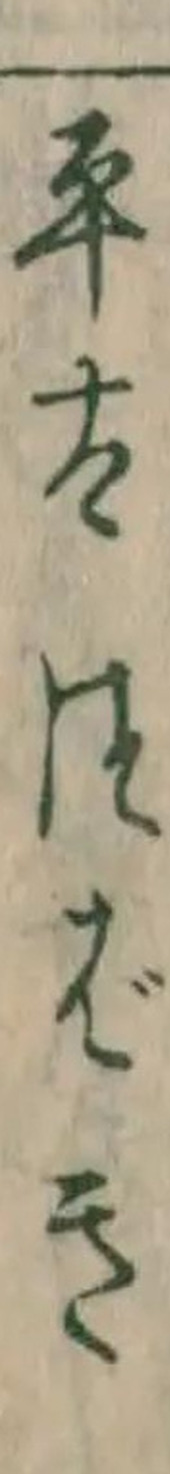平吉つばき
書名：草木奇品家雅見 3巻. [3]
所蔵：国立国会図書館 National Diet Library, JAPAN
